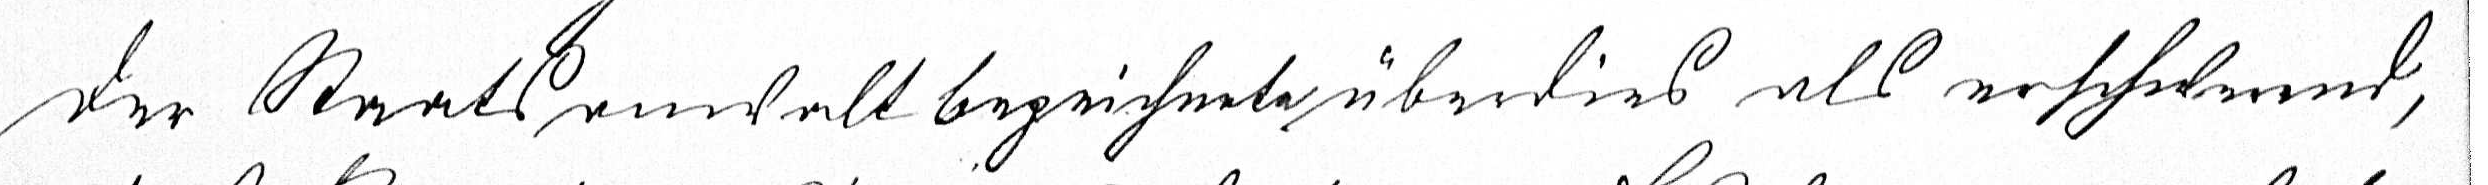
Der Staatsanwalt bezeichnete überdies als erschwerend,
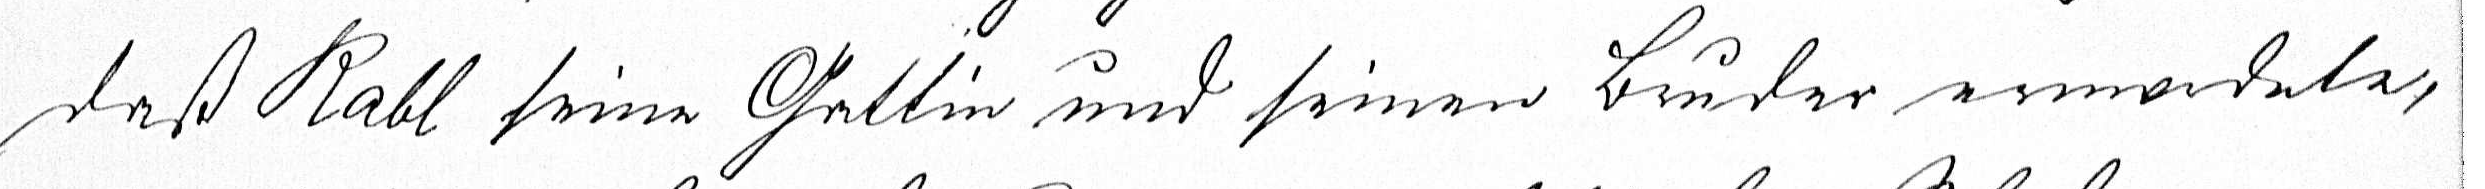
daß Rabl seine Gattin und seinen Bruder ermordete,
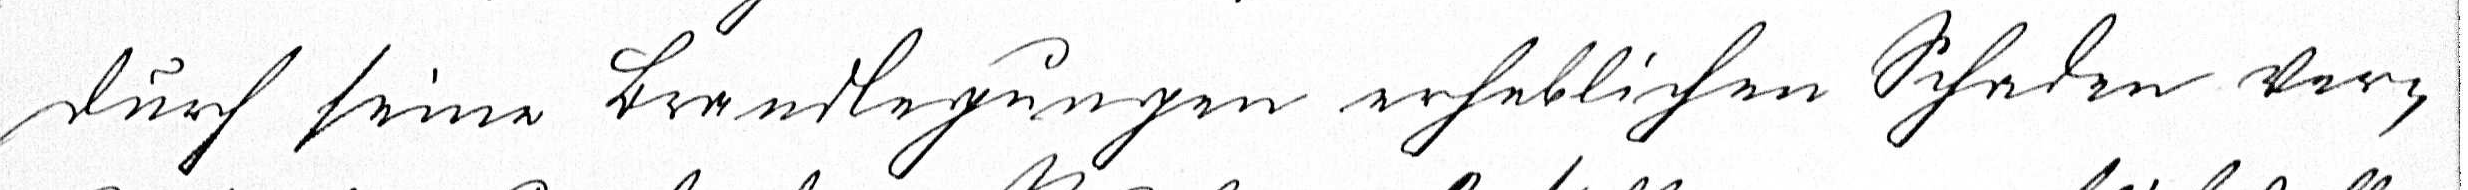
durch seine Brandlegungen erheblichen Schaden ver¬
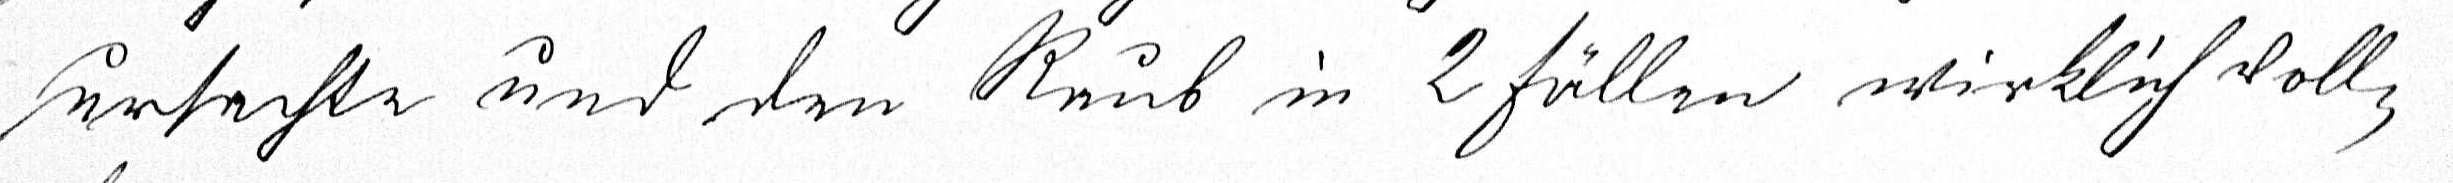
ursachte und de Raub in 2 Fällen wirklich voll¬
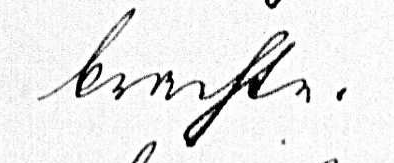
brachte.
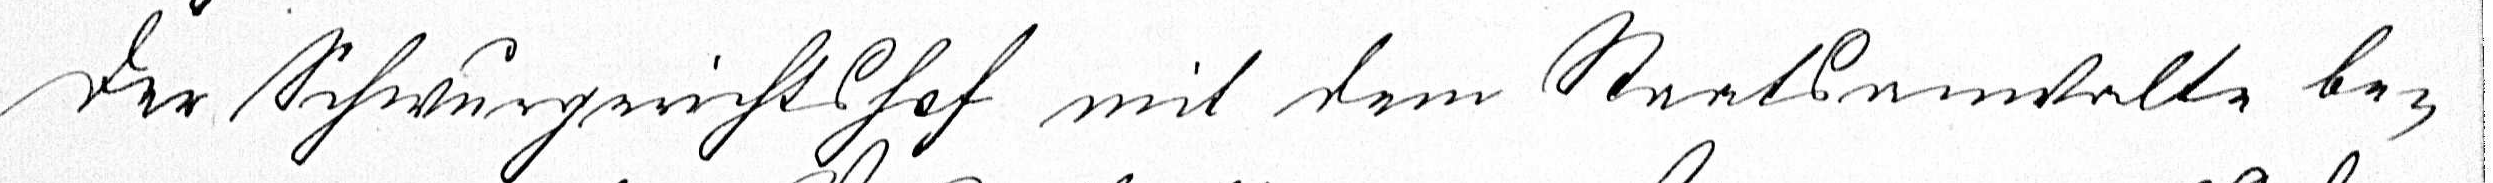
Der Schwurgerichtshof mit dem Staatsanwalte be¬
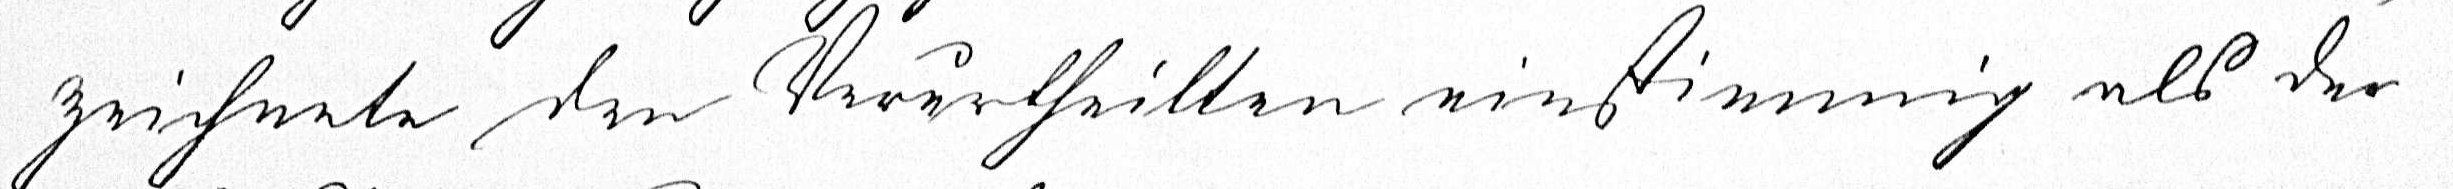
zeichnete den Verurtheilten einstimmig als der
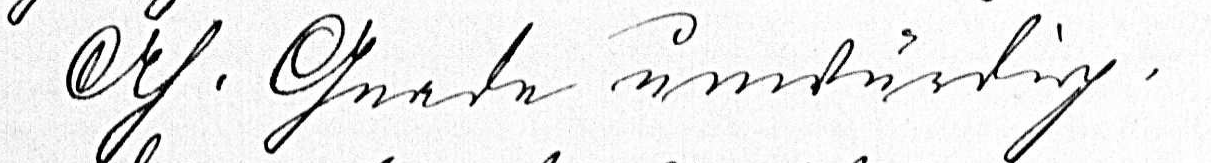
Ah. Gnade unwürdig.
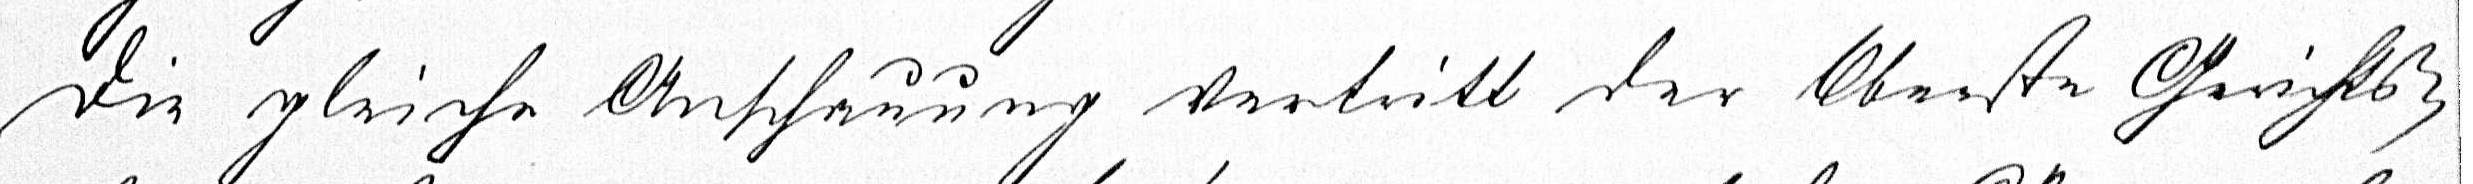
Die gleiche Anschauung vertritt der Oberste Gerichts¬
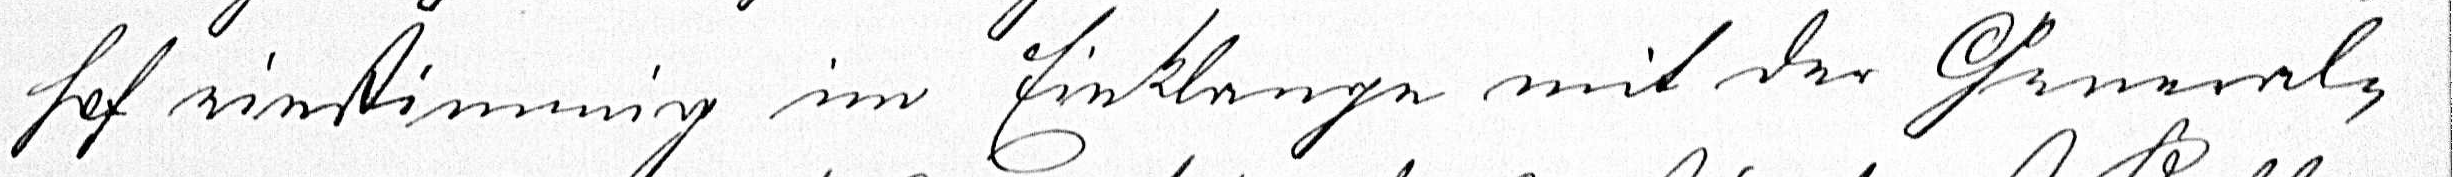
hof einstimmig im Einklange mit der General¬
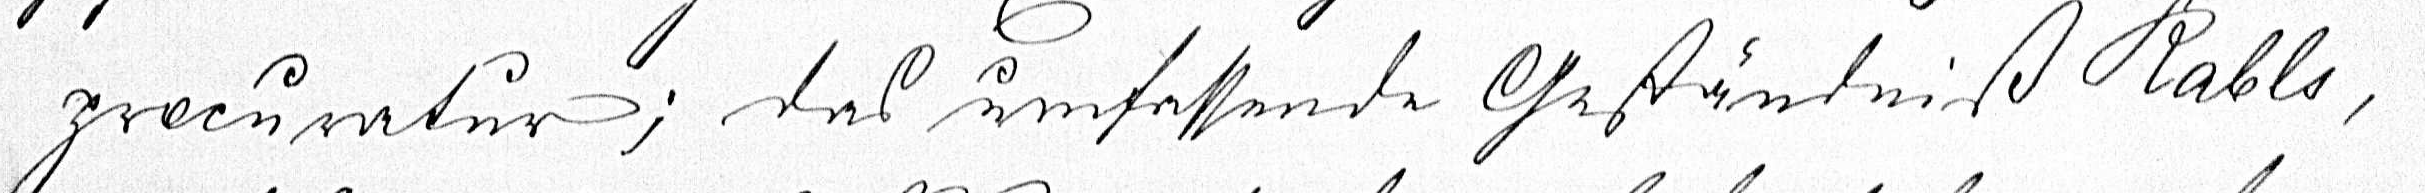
procuratur; das umfassende Geständniß Rabls,
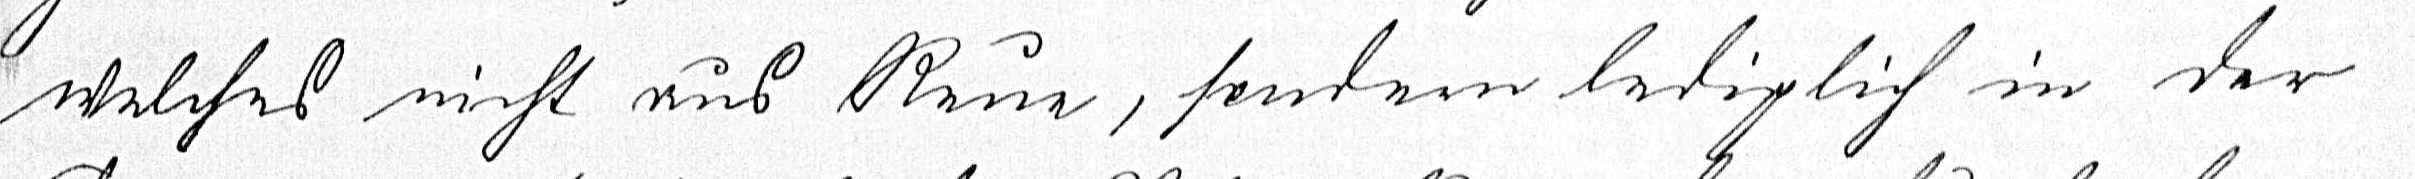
welches nicht aus Reue, sondern lediglich in der
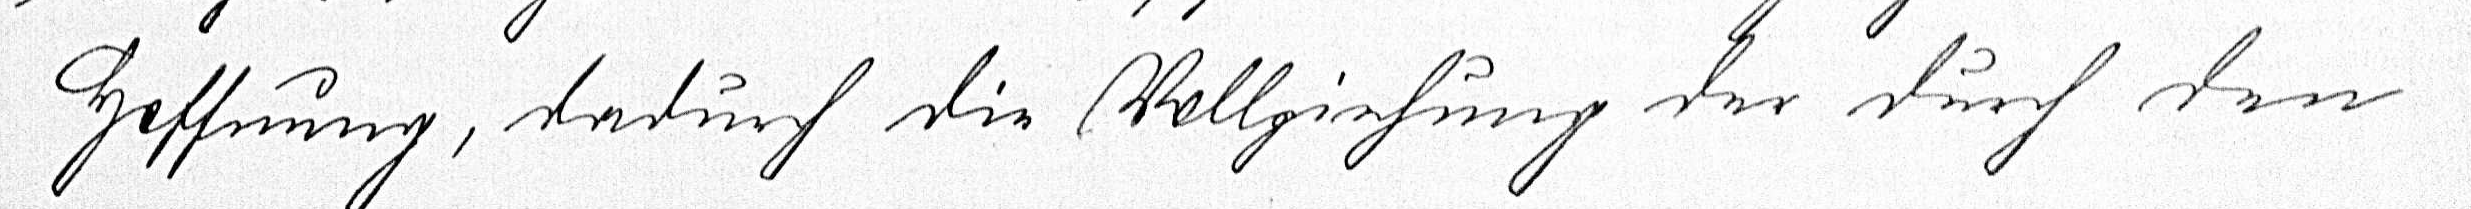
Hoffnung, dadurch die Vollziehung der durch den
